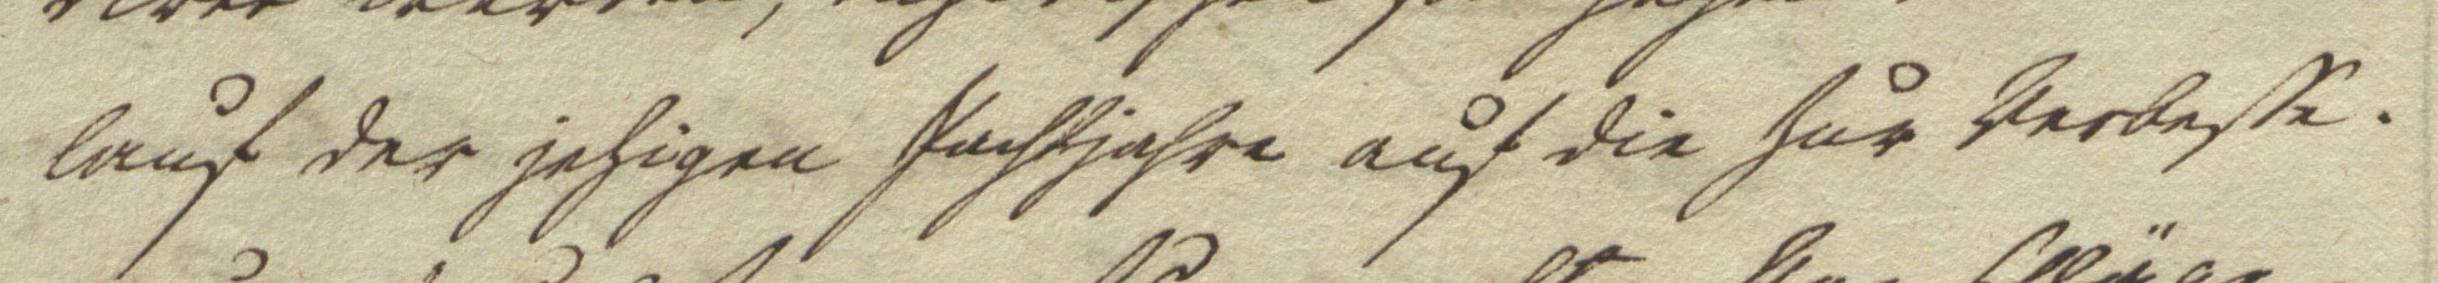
lauf der jetzigen Pachtjahre auf die zur Verbesse¬
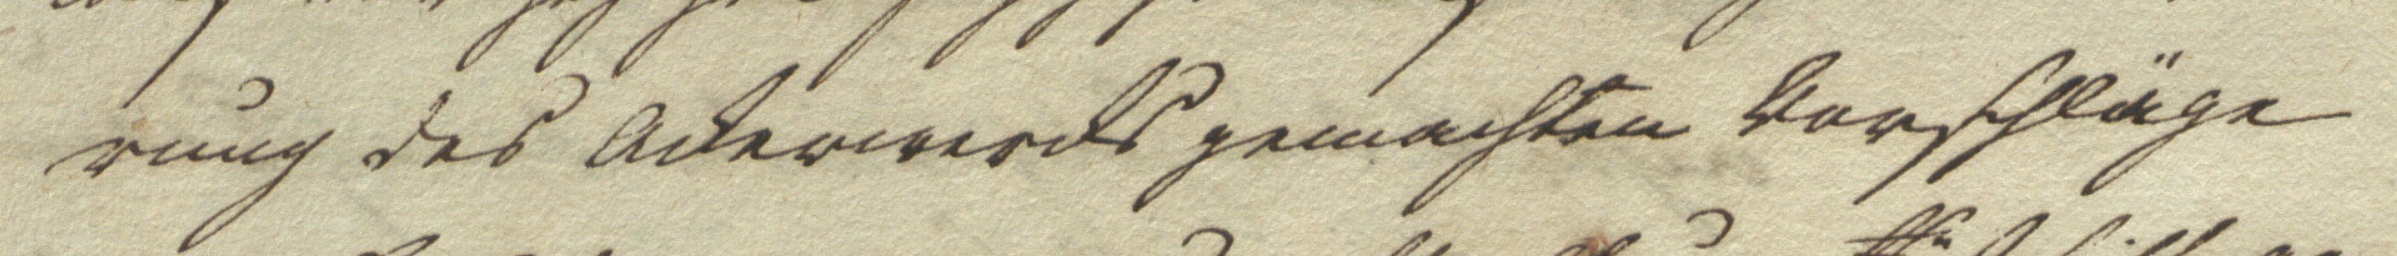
rung des Ackerwerks gemachten Vorschläge
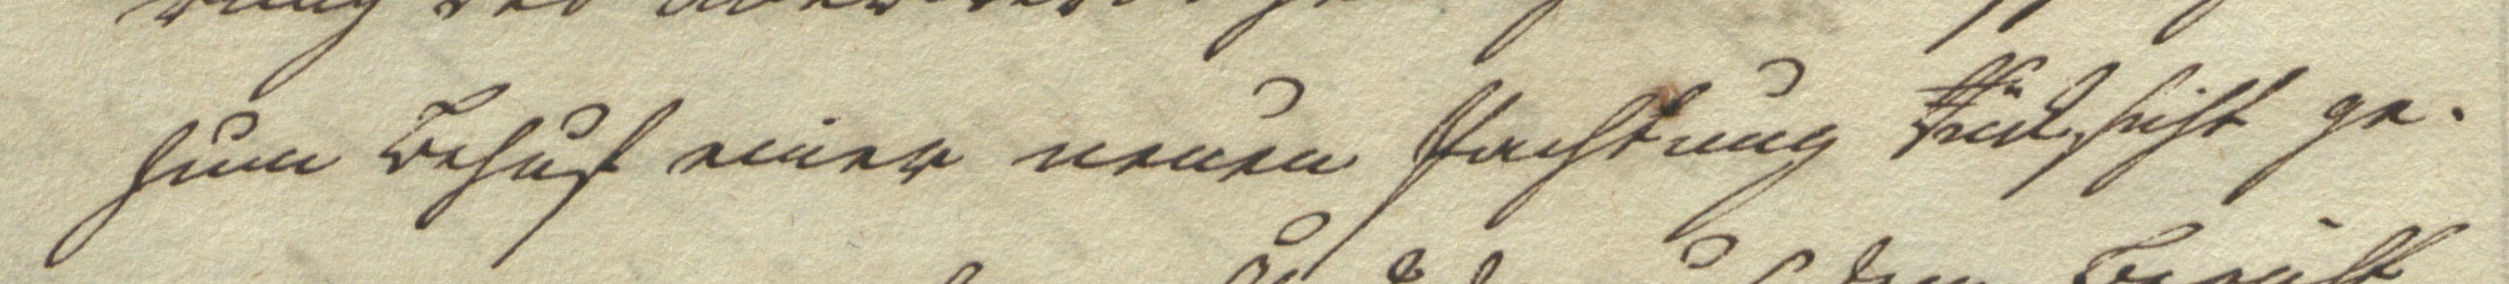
zum Behuf einer neuen Pachtung Rücksicht ge¬
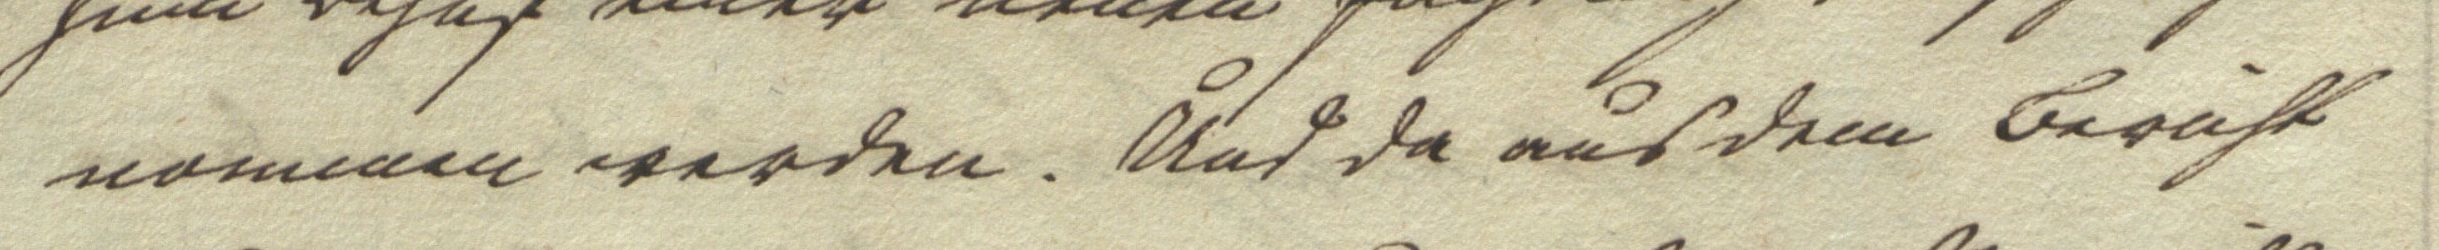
nommen werden. Und da aus dem Bericht
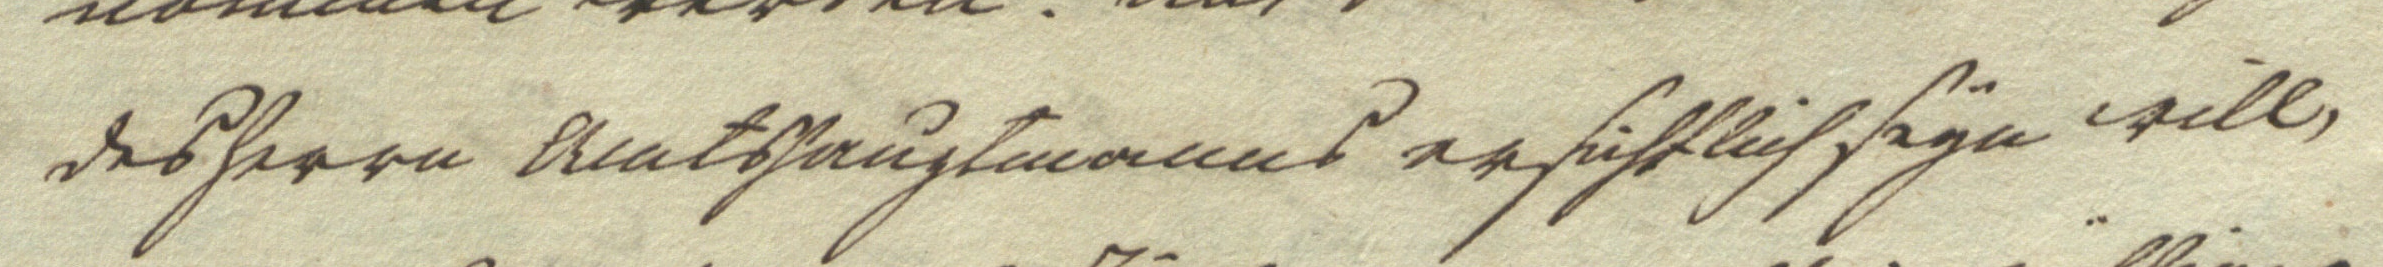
des Herrn Amtshauptmanns ersichtlich seyn will,
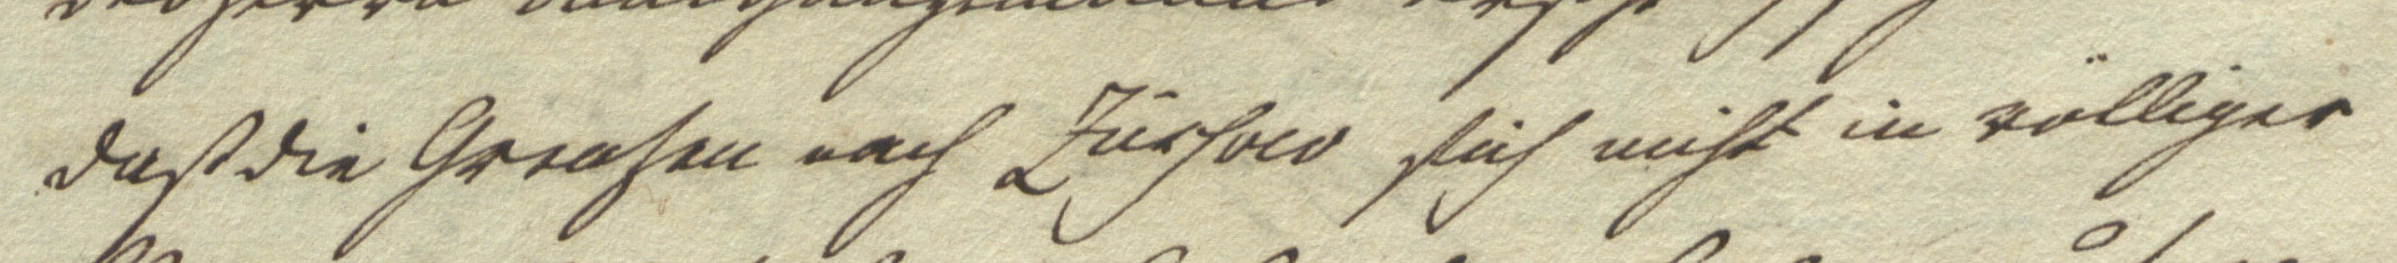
daß die Grenzen nach Züssow sich nicht in volliger
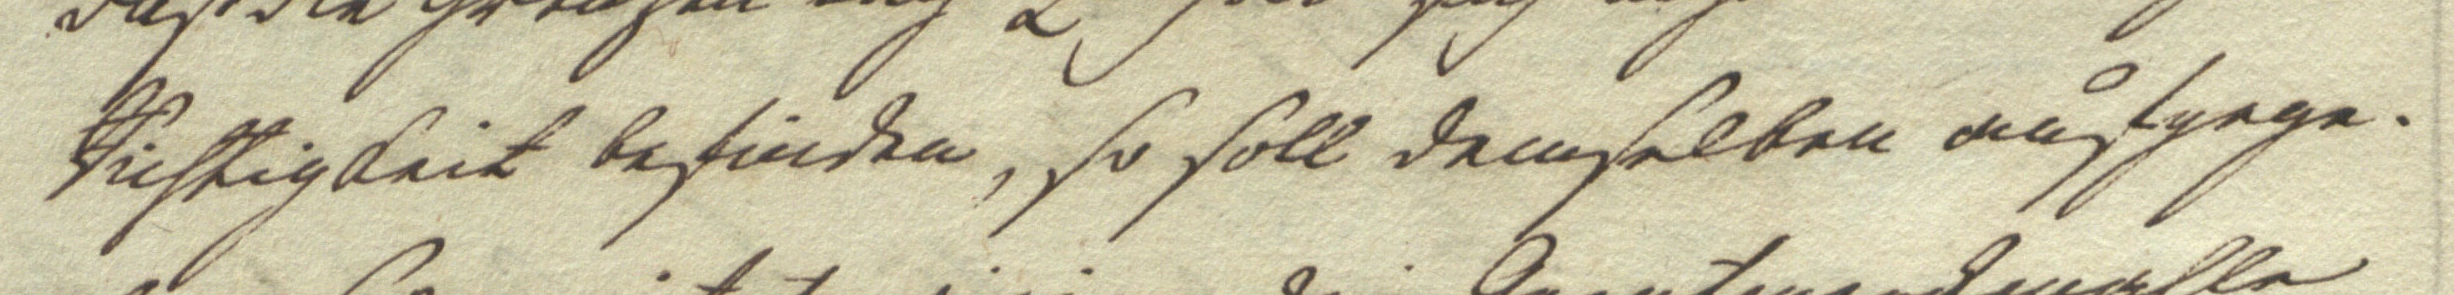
richtigkeit befinden, so soll demselben aufgege¬
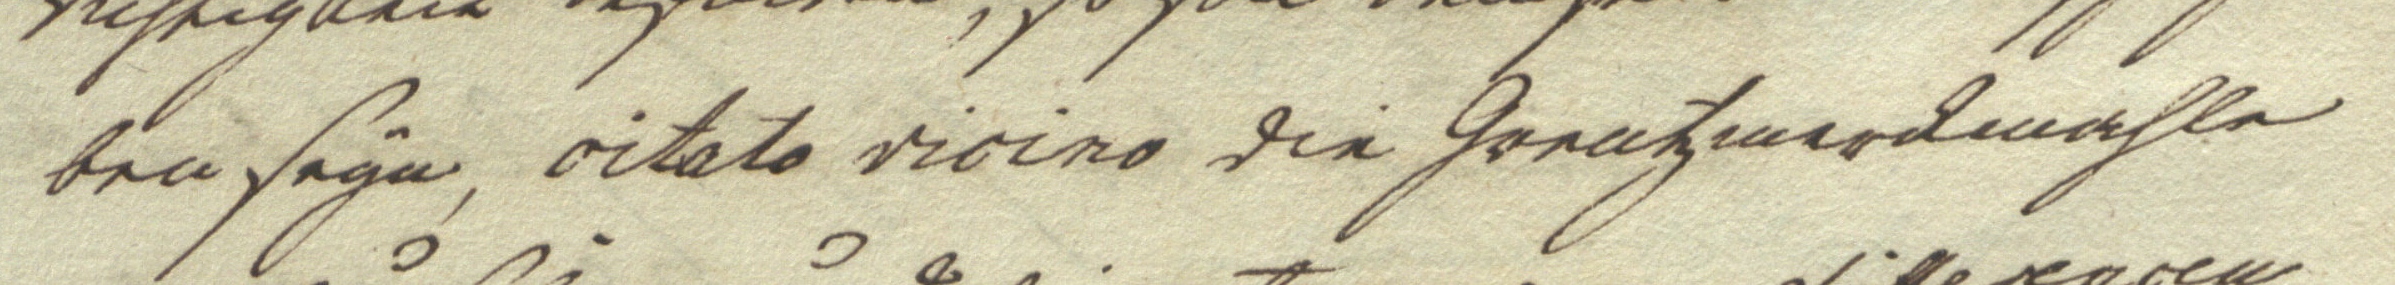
ben seyn, citato vicino die Grentzmerkmahle
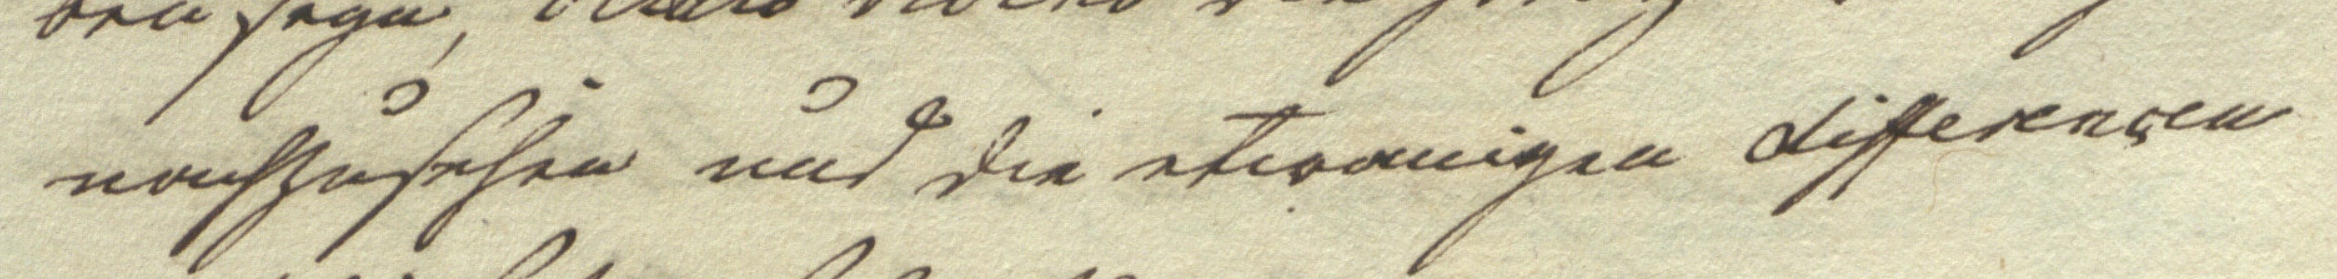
nachzusehen und die etwanigen differencen
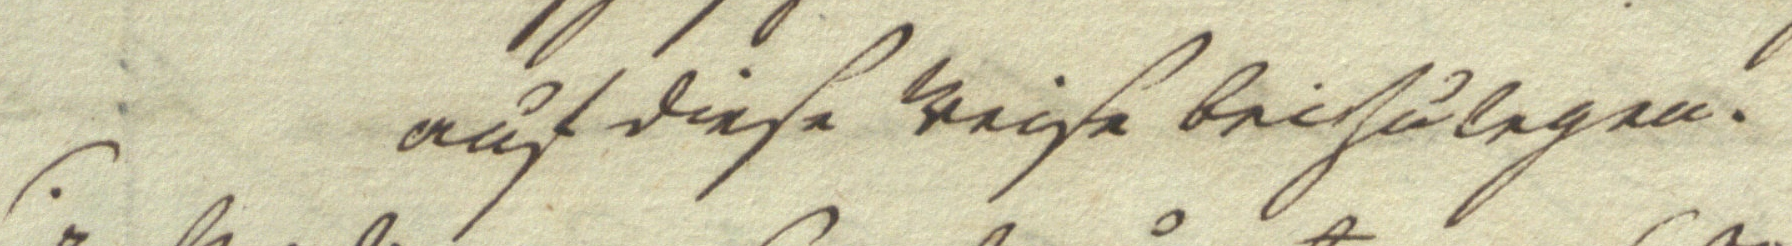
auf diese Weise beizulegen.
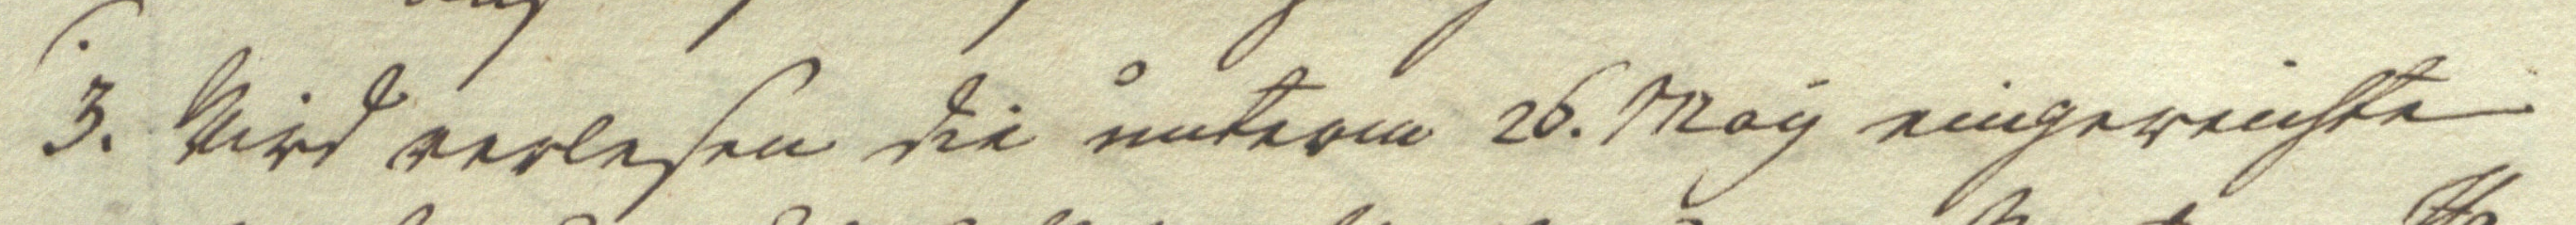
3. Wird verlesen die unterm 26. may eingereichte
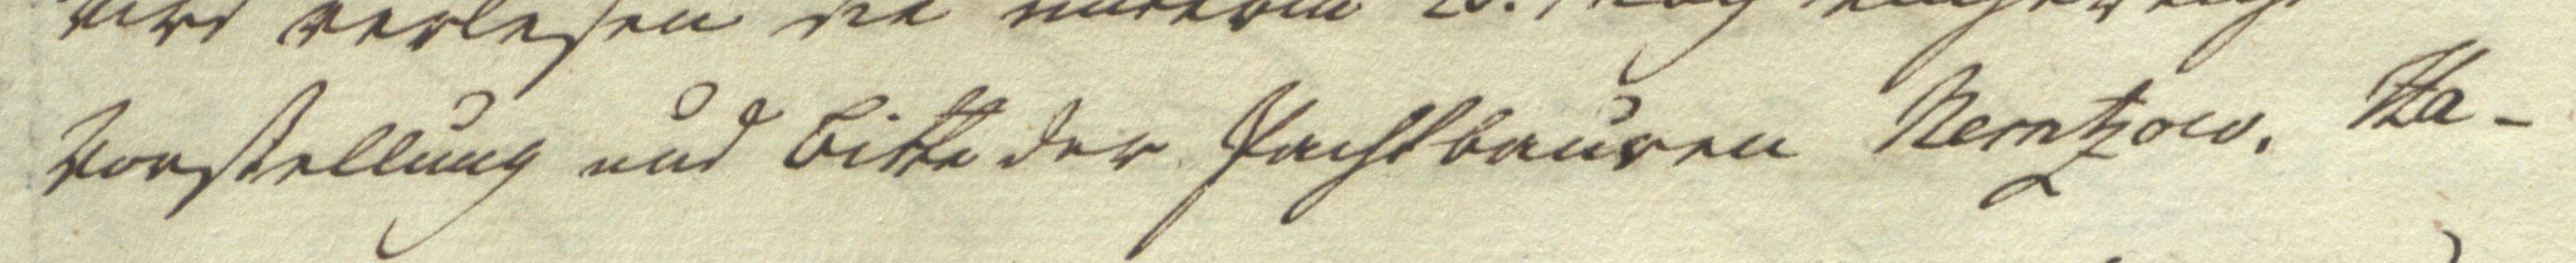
Vorstellung und Bitte der Pachtbauren Nemtzow, Ha¬
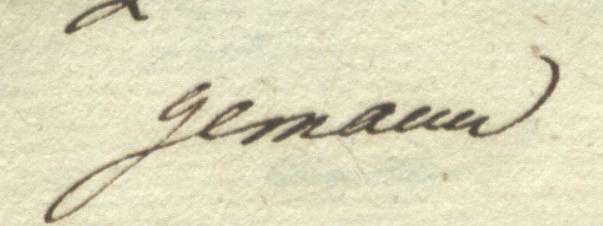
gemann
